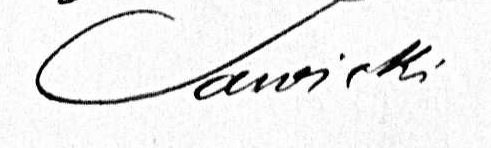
Sawicki
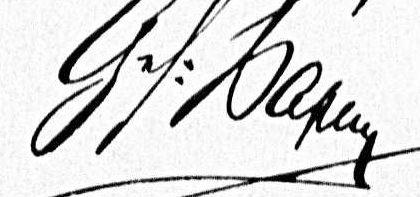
Ges. Papay
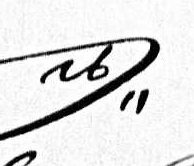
26/11
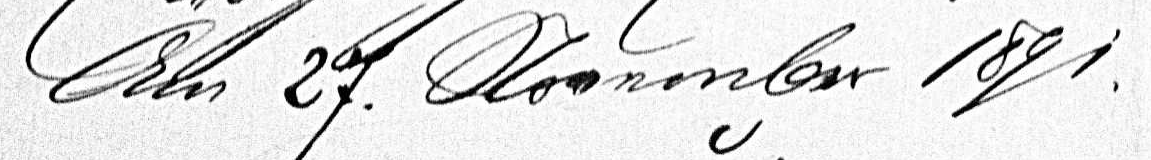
Am 27. November 1891
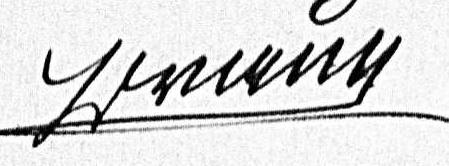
Braun
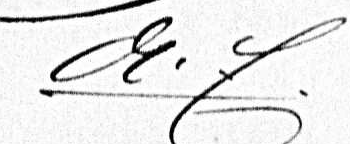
A. E.
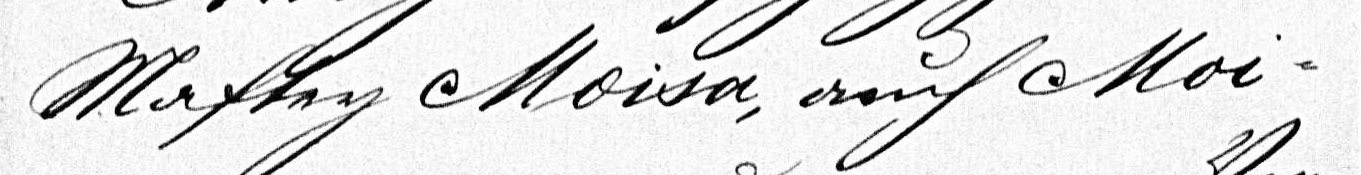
Maftey Moisa, auch Moi¬
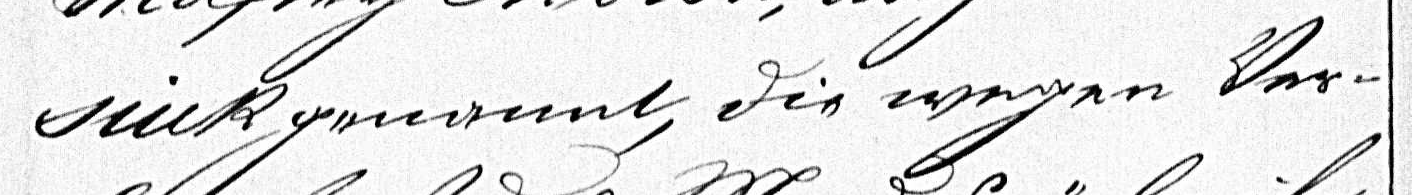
siuk genannt, die wegen Ver¬
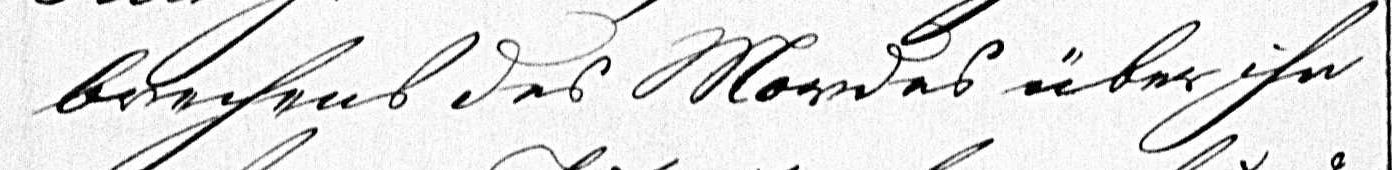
brechens des Mordes über ihn
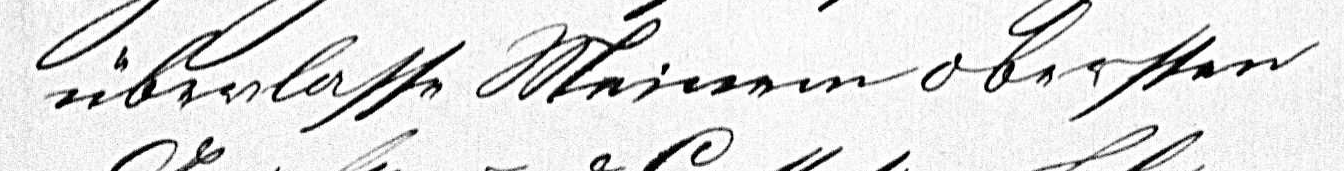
überlasse Meinem Obersten
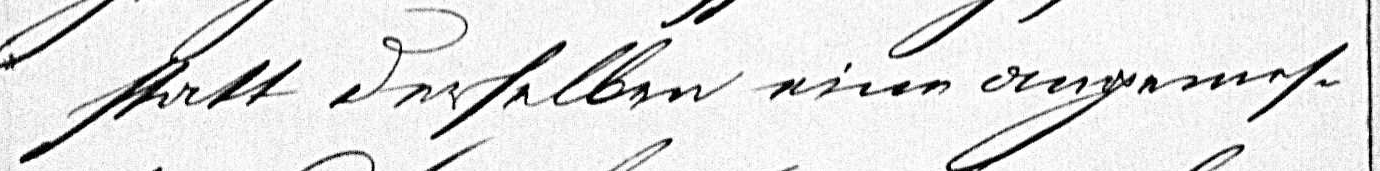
statt derselben eine angemes¬
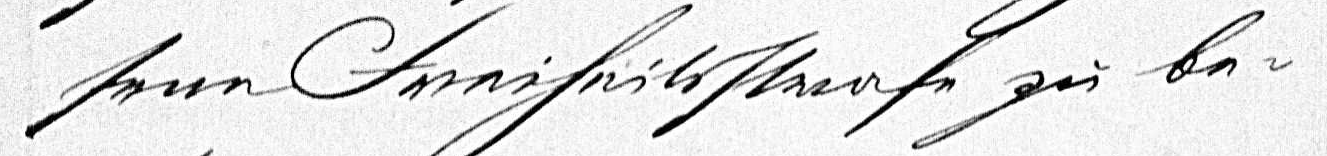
sene Freiheitsstrafen zu be¬
